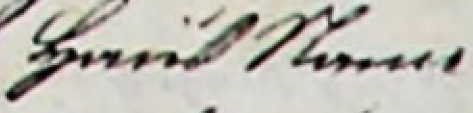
Haus Name
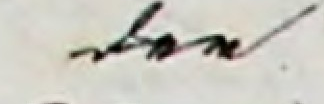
der
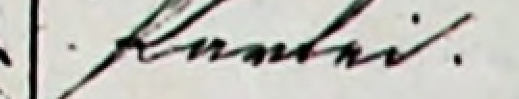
Partei.
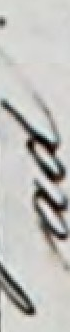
ad
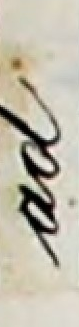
ad
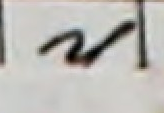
?
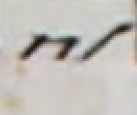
???
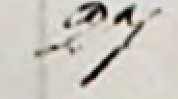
27
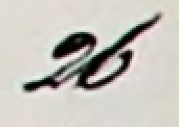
26
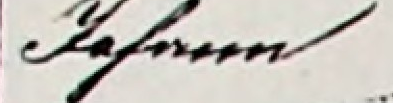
26
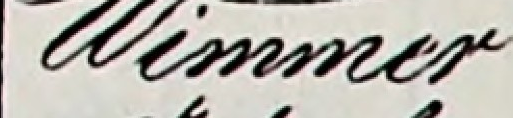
Johann
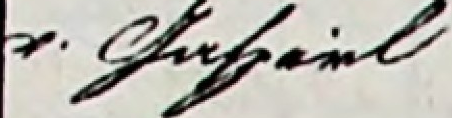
Wimmer v. Gasperl
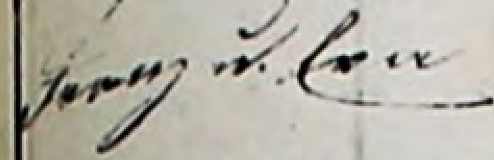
Franz u. Eva
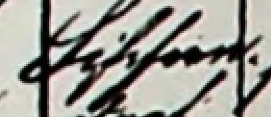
Fischern„
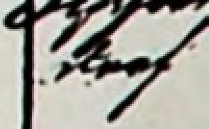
dorf
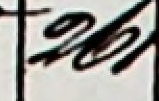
261
